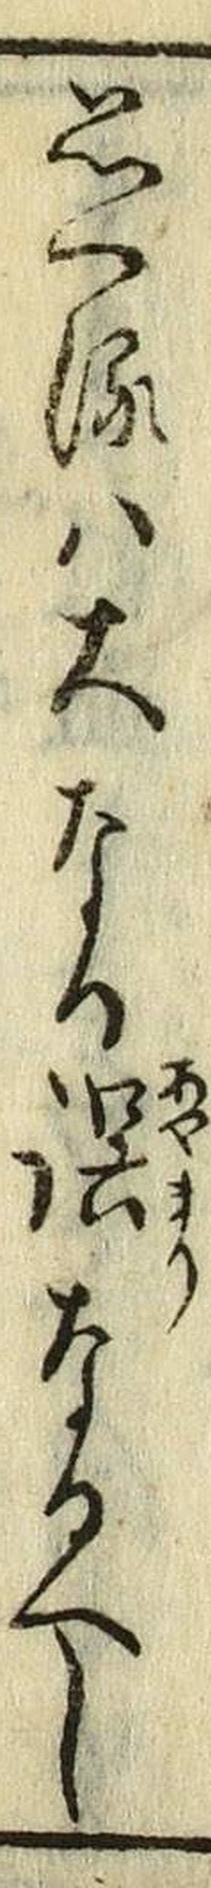思へるは大なる誤なるへし
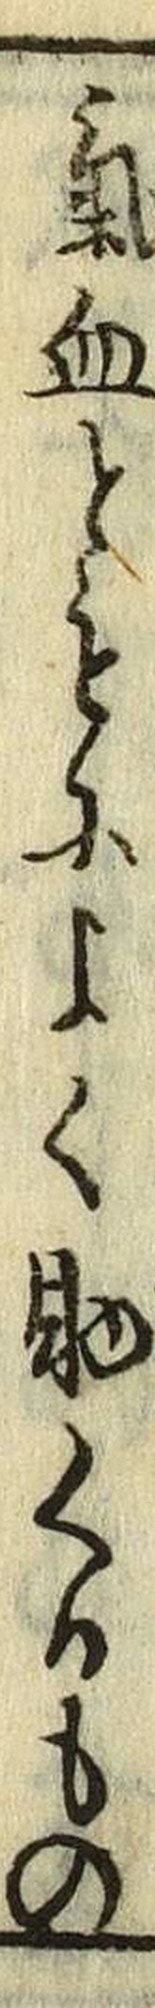気血ともによく助くるもの
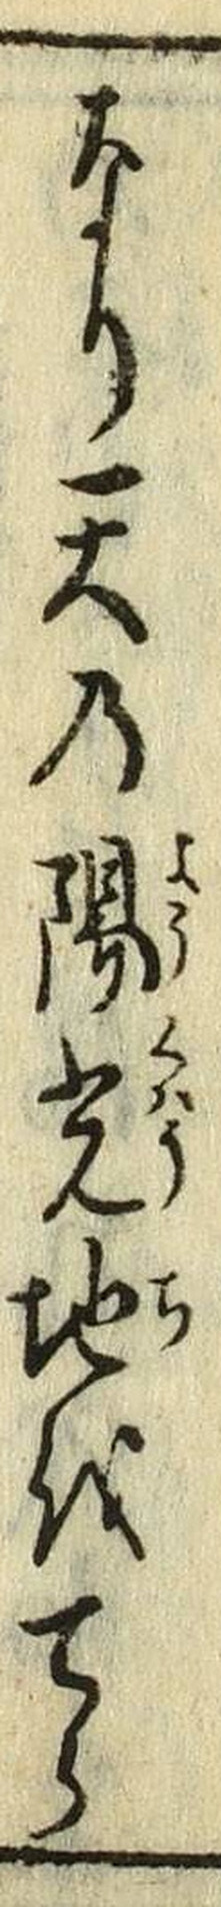なり天の陽光地をてら
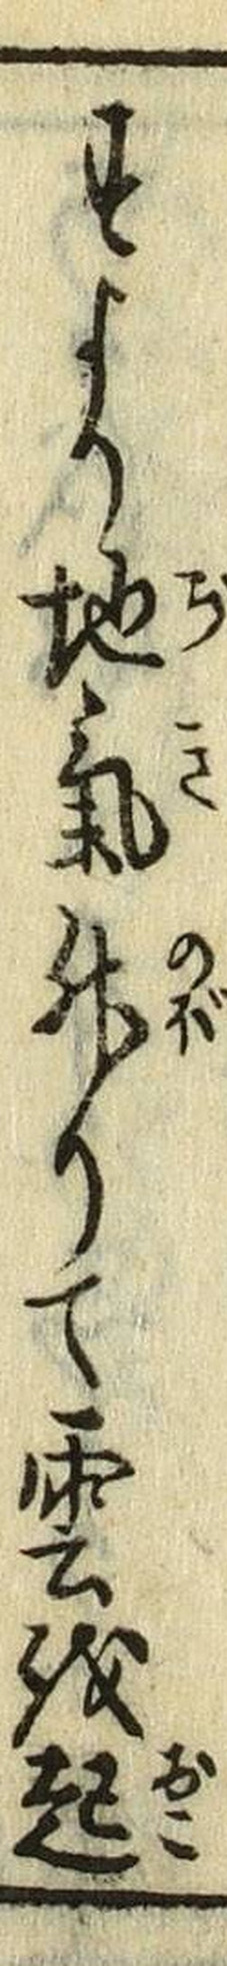すより地気升りて雲を起
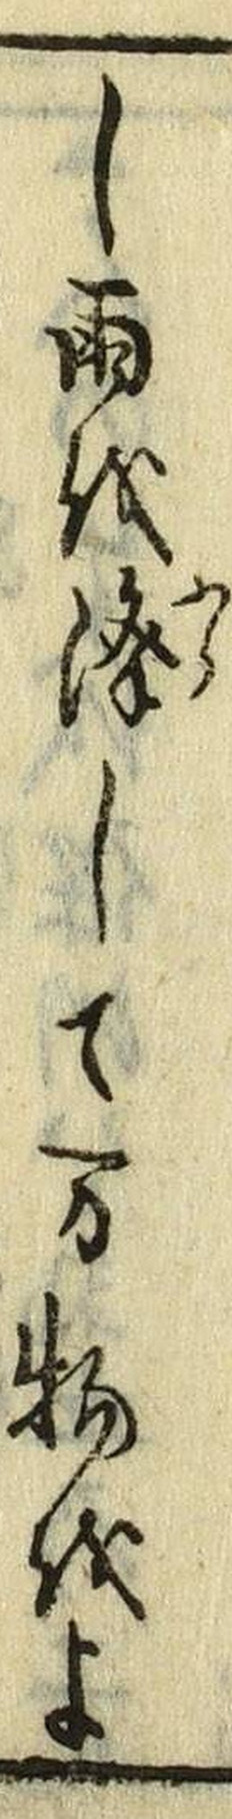し雨を降して万物をよ
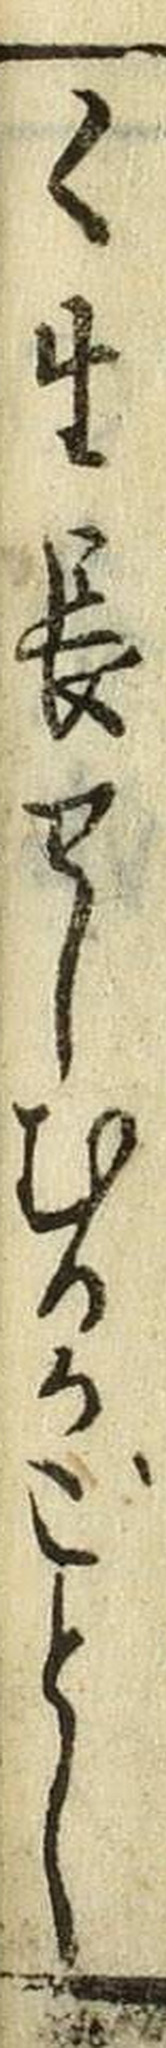く生長せしむるかごとし
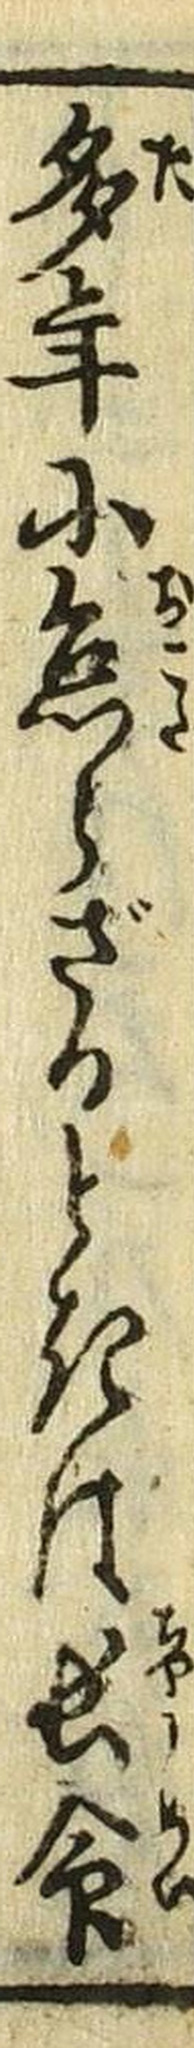多年に怠らざるときは長命
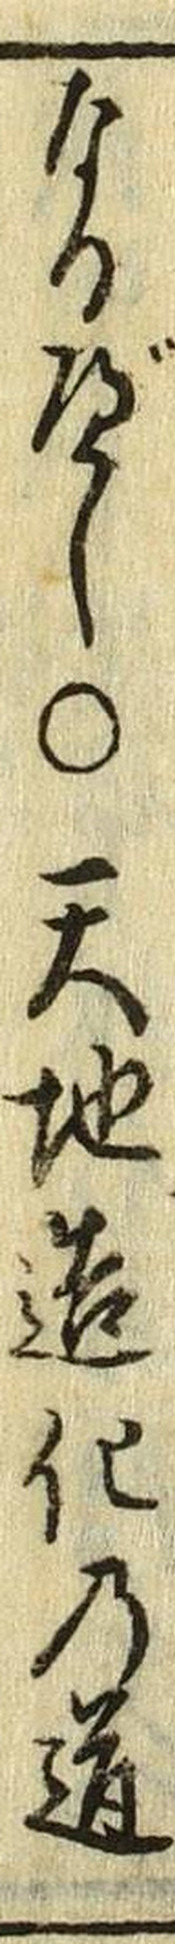なるべし○天地造化の道
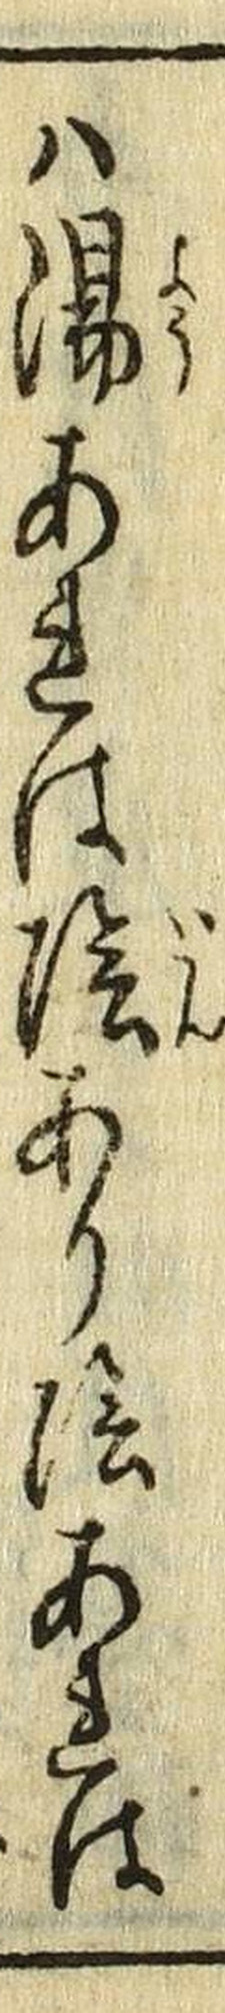は陽あれは陰あり陰あれは
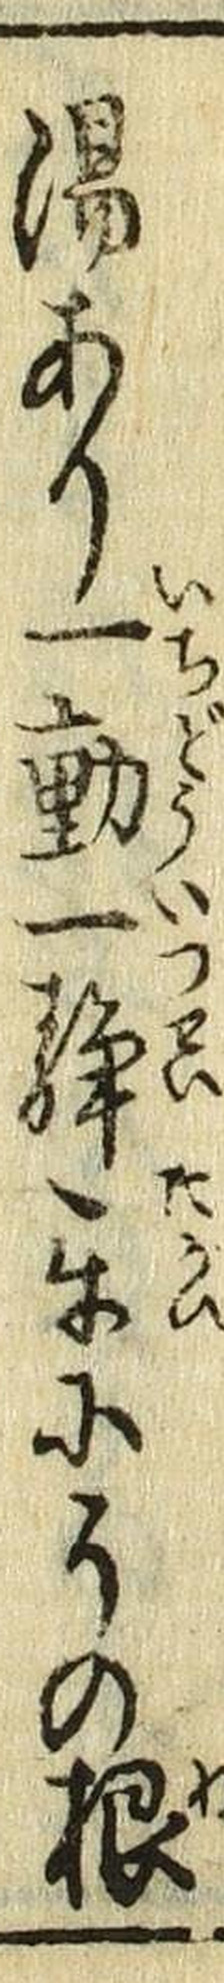陽あり一動一静互にその根
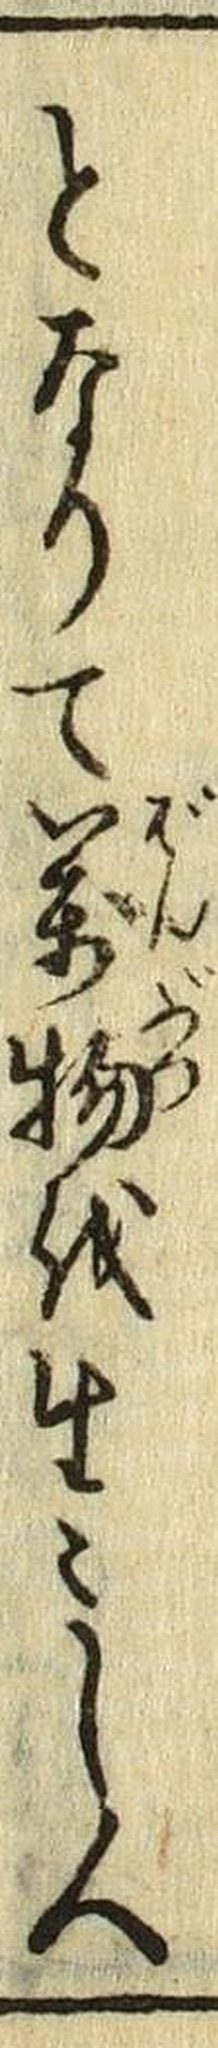となりて万物を生みし人
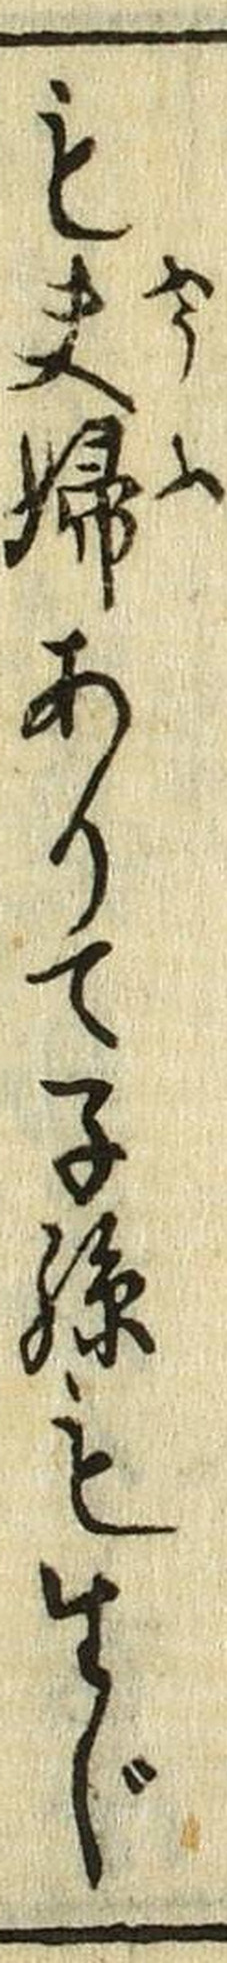も夫婦ありて子孫も生じ
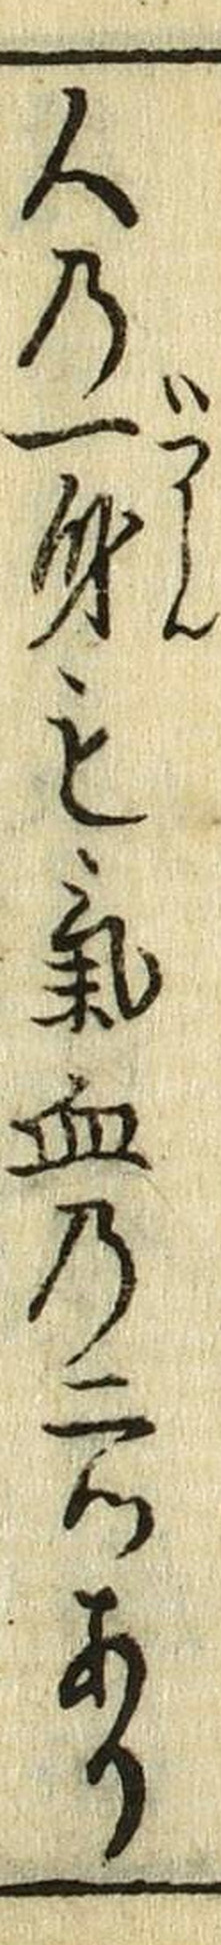人の一身も気血の二ツあり
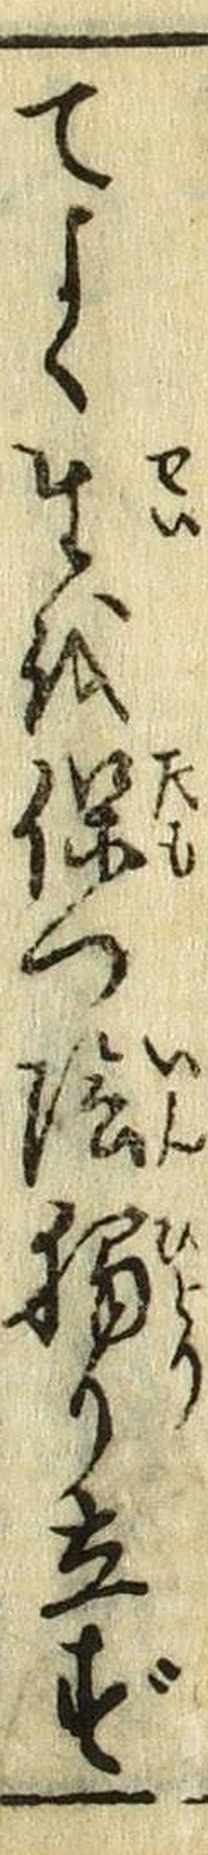てよく生を保つ陰独り立ず
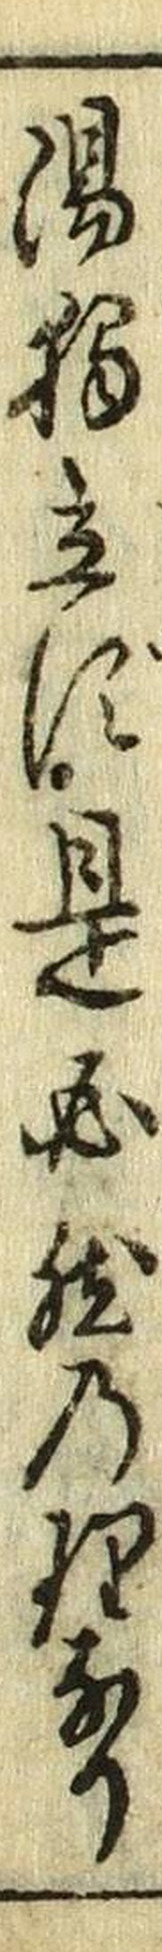陽独立ず是必然の理なり
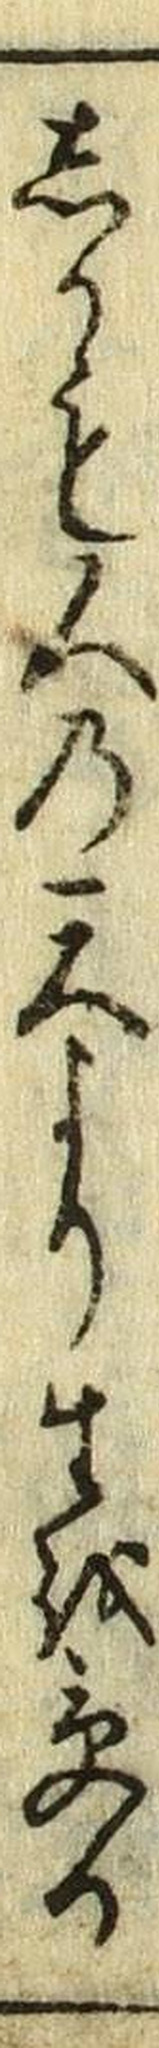しかも人の天より生を受る
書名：居家養生記
